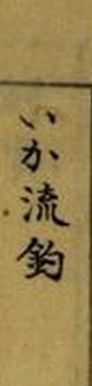いか流釣

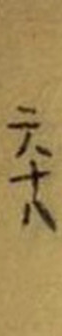六十八

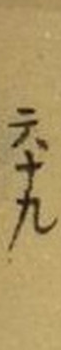六十九
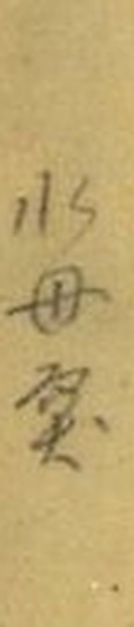水母突
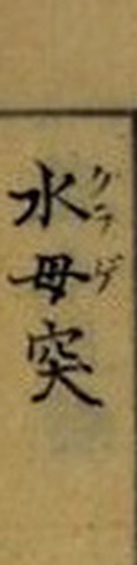水母突

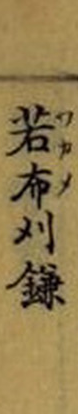若布刈鎌

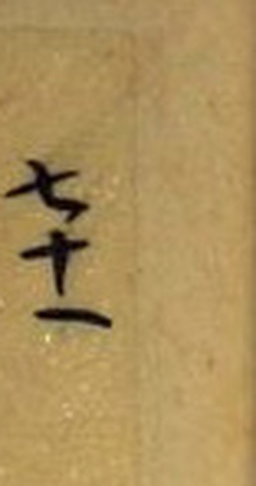七十一
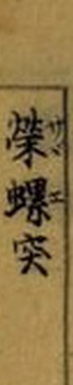栄螺突

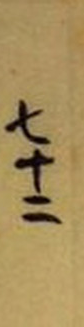七十二

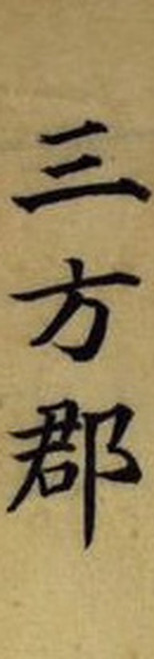三方郡
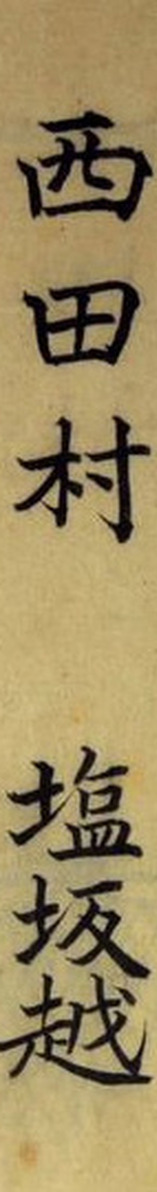西田村塩坂越

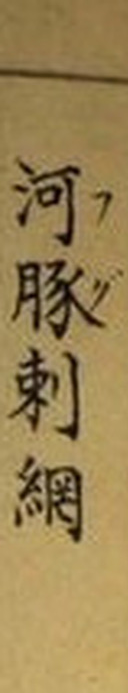河豚刺網

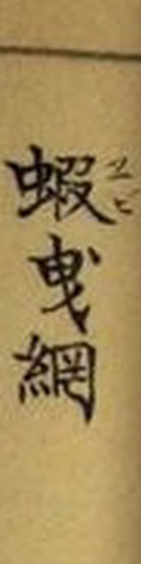蝦曳網

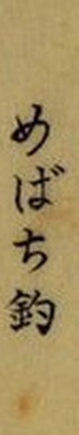めばち釣

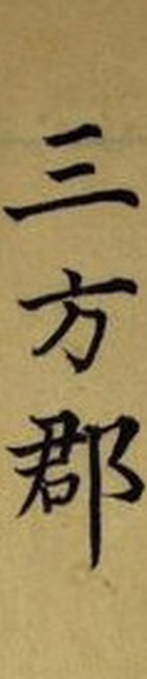三方郡
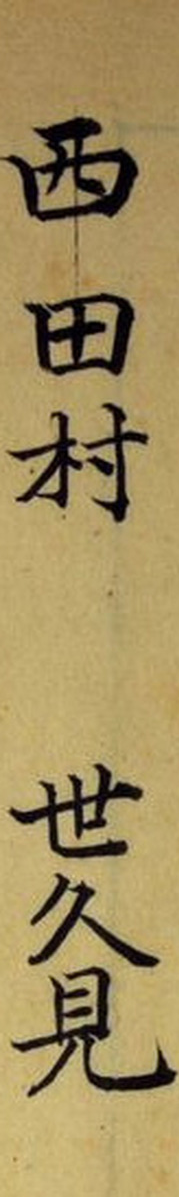西田村世久見
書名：漁具図 若狭海ノ部[画像あり]
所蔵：福井県文書館 Fukui Prefectural Archives
